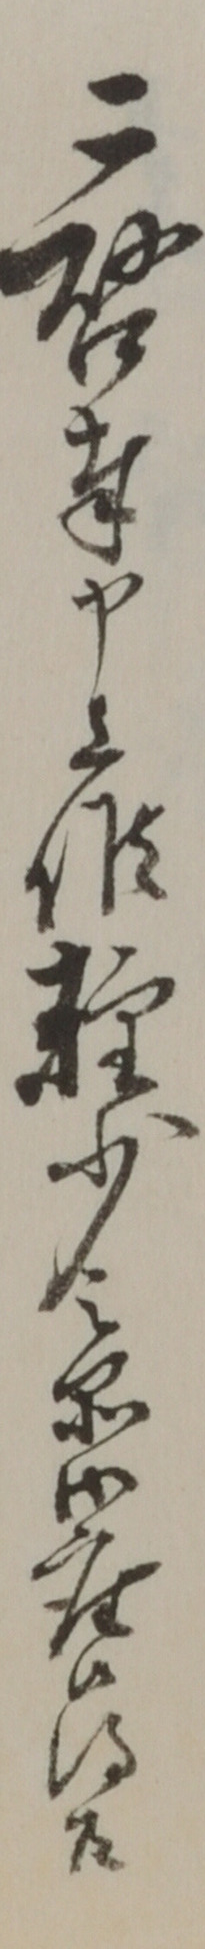二啓奉申上候軽少之品御座候得共
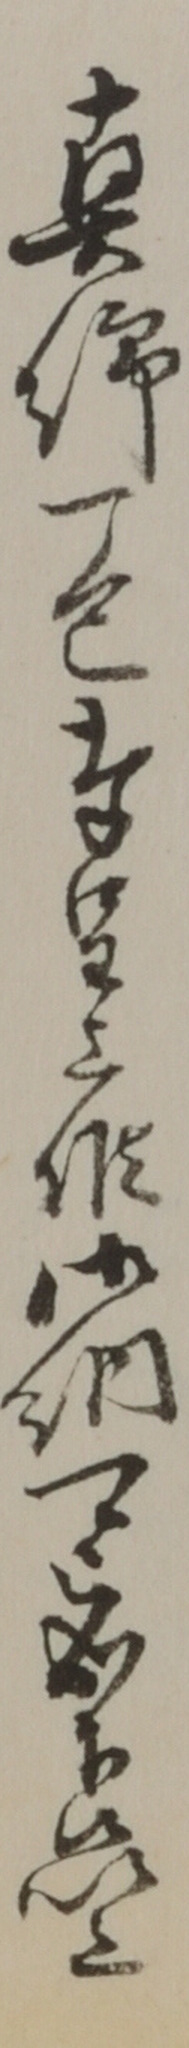真綿一包奉呈上候御納可被成下候以上

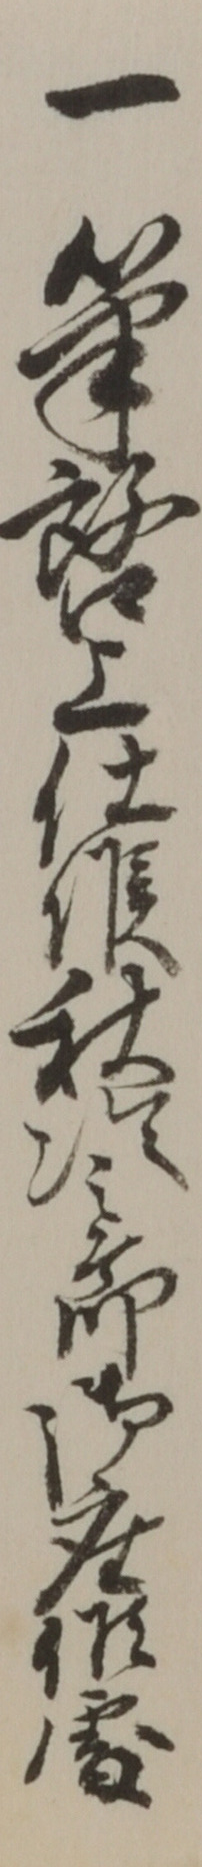一筆啓上仕候秋冷之節御座候処
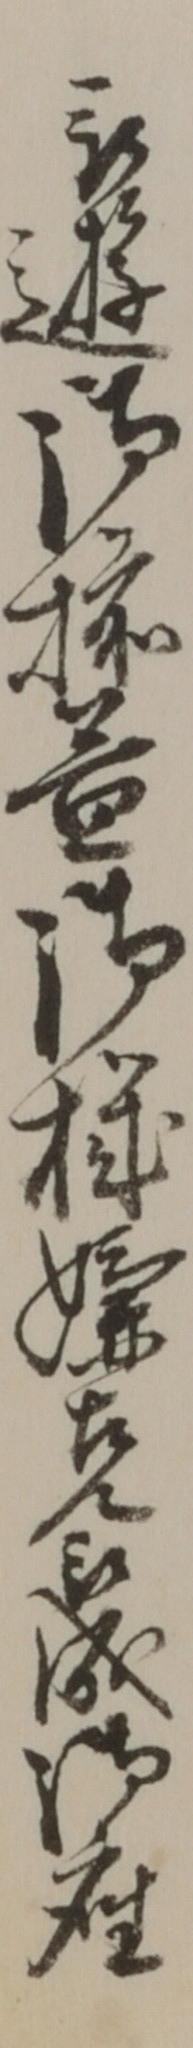被遊御揃益御機嫌克被成御座
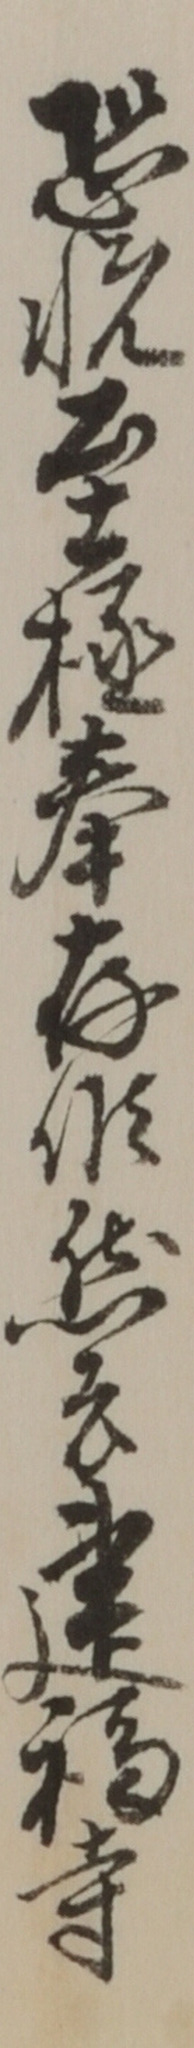恐悦至極奉存候然共建福寺
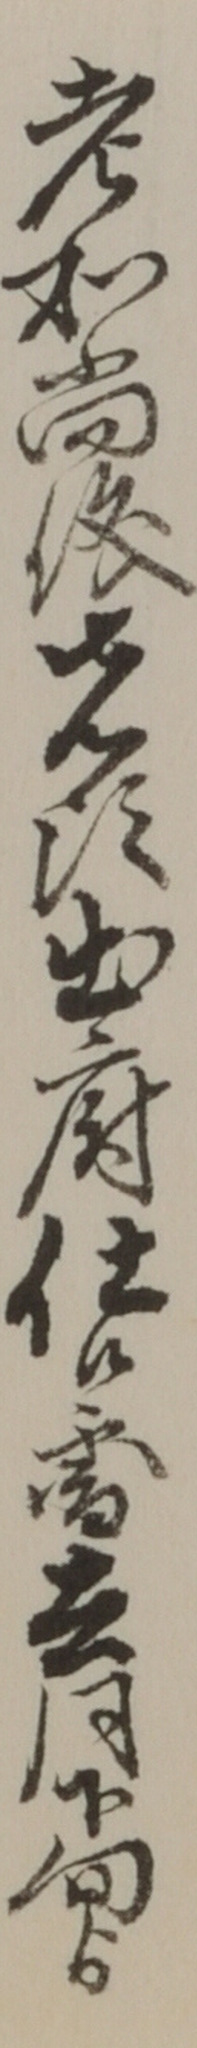老和尚儀先頃出府仕候処去月下旬ゟ
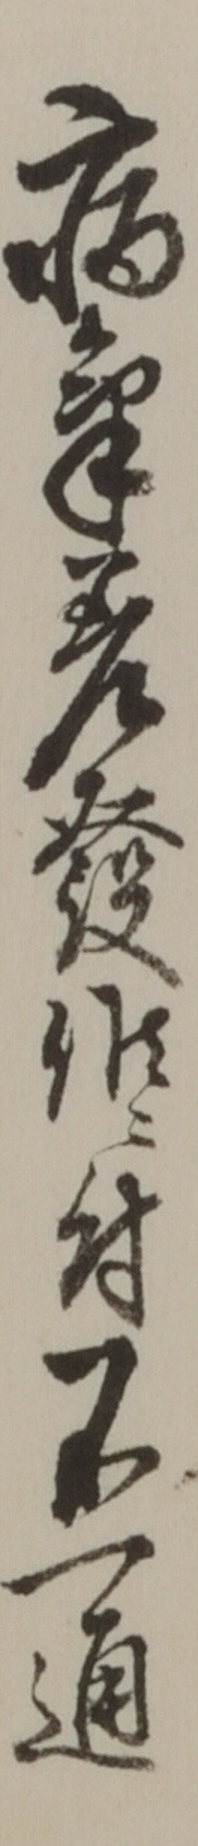病気差発候ニ付不一通
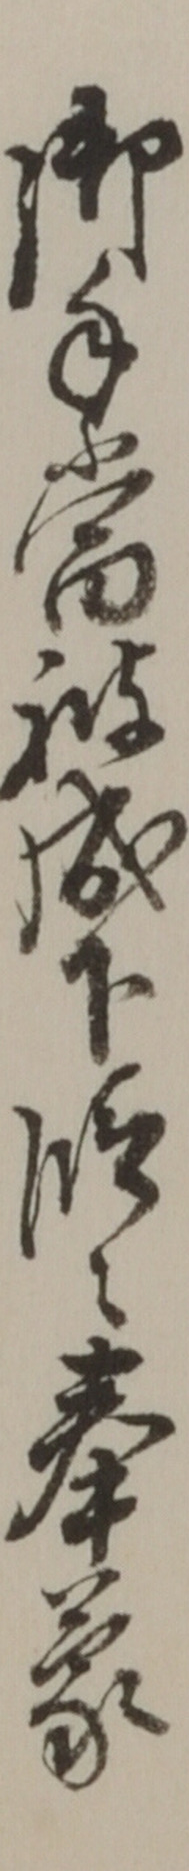御手当被成下段々奉蒙
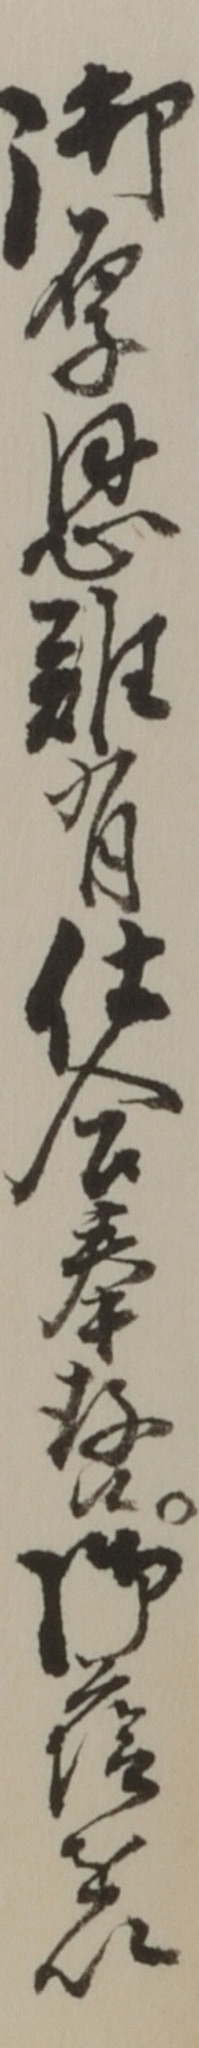御厚恩難有仕合奉存候。御蔭を以
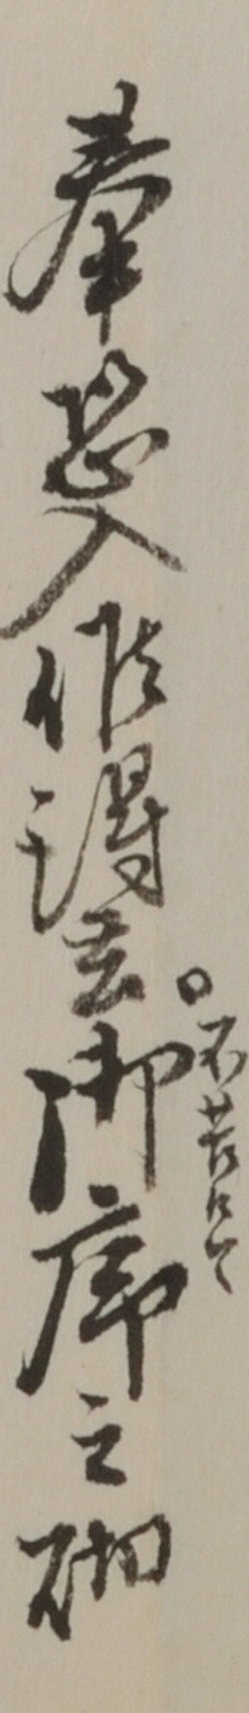奉恐入候得共。御序之砌
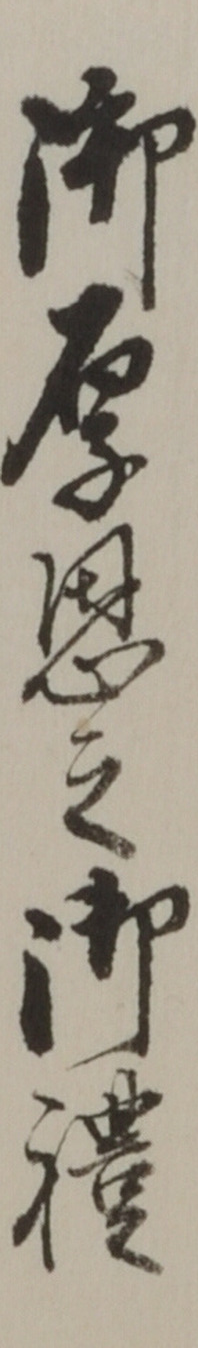御厚恩之御礼
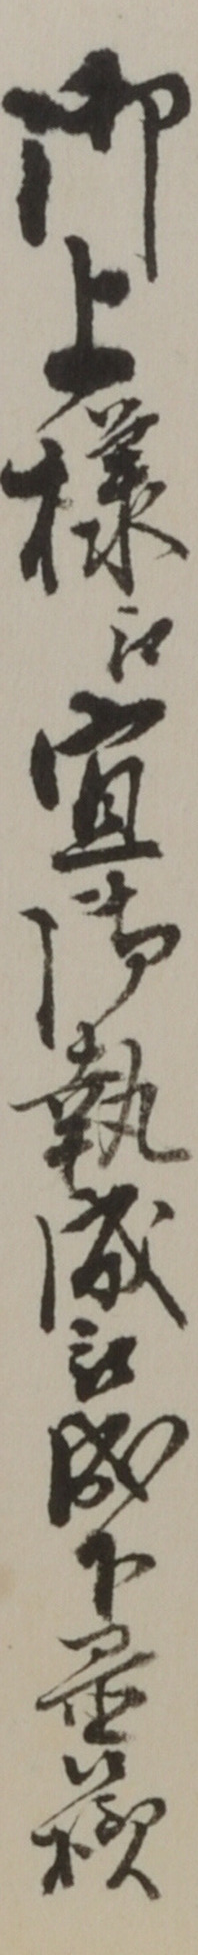御上様江宜御執成被成下置候様
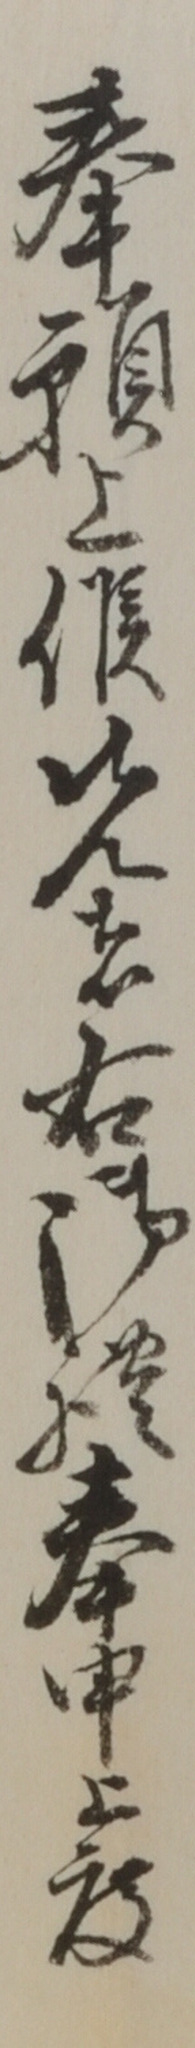奉願上候先者右御礼奉申上度
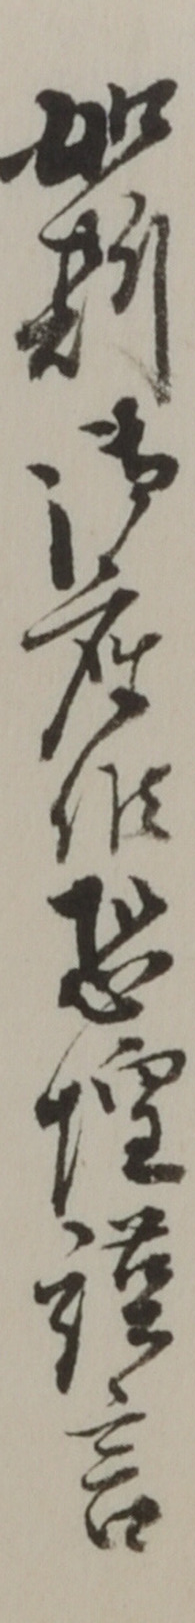如斯御座候恐惶謹言
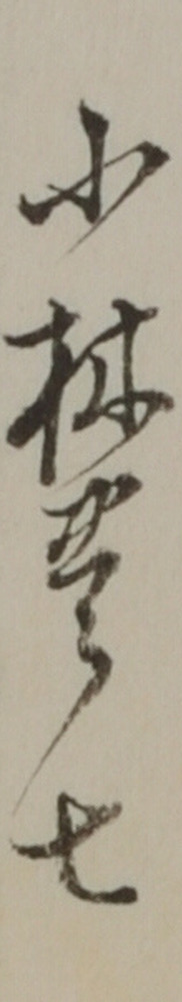小林豊七
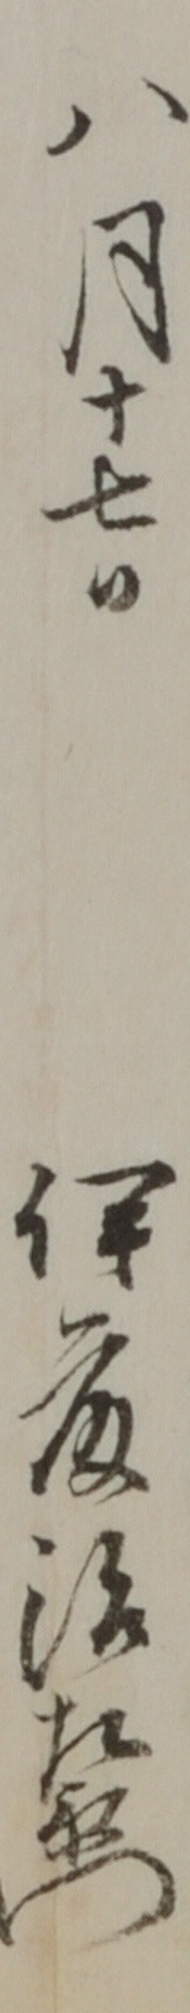八月十七日伊藤治左衛門
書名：書状
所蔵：伊那市立高遠町図書館・合同会社AMANE
